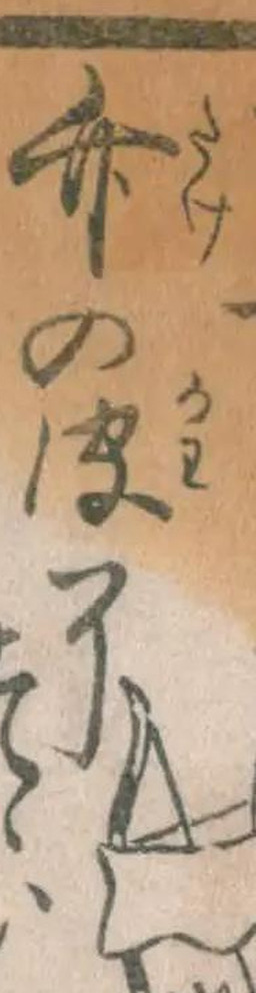竹の皮に
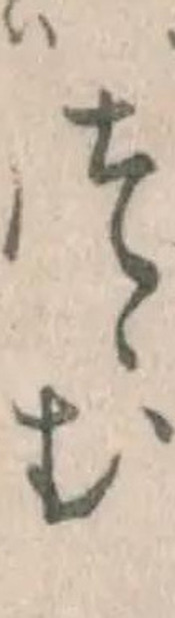つゝむ
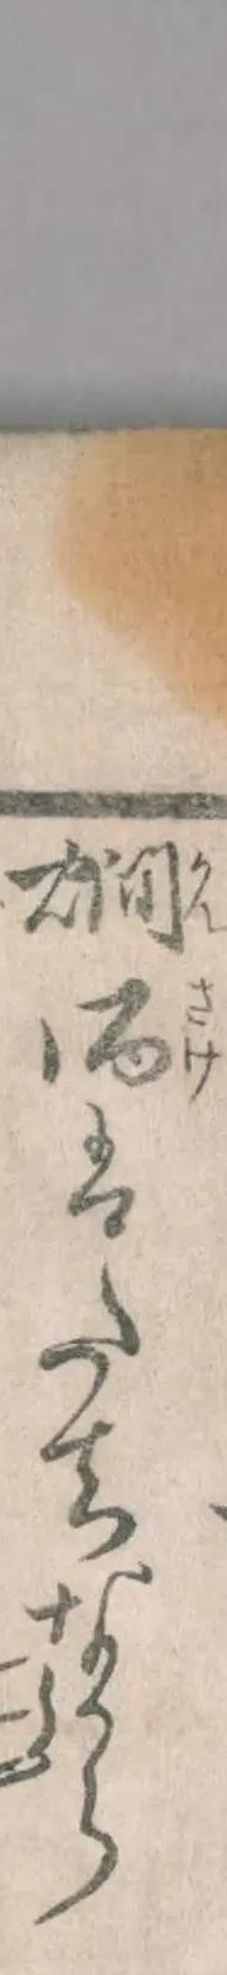燗酒はたちなから
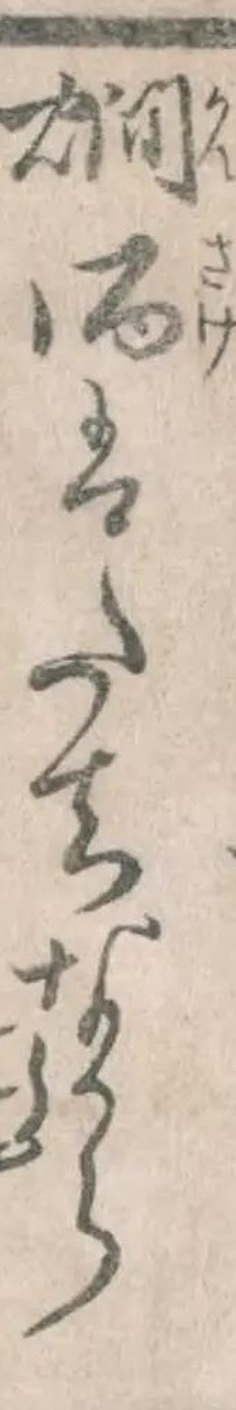燗酒はたちなから
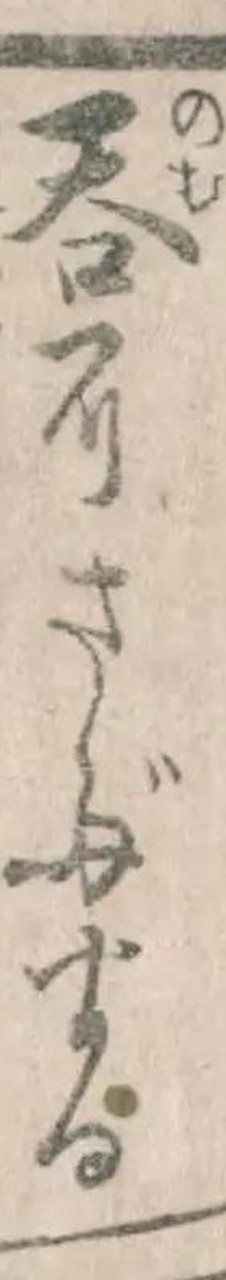呑にさだまる
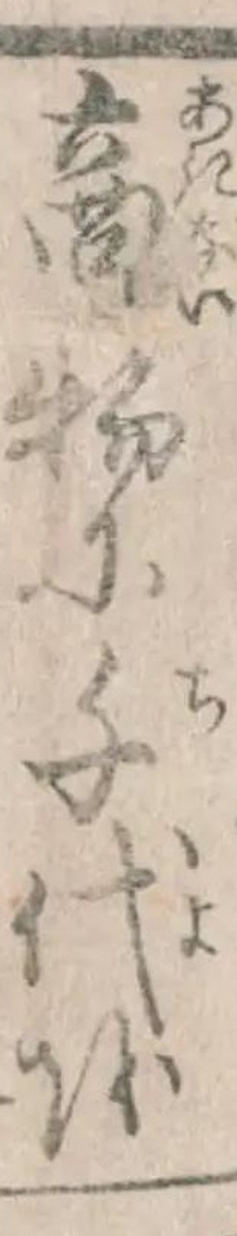商物に千代を
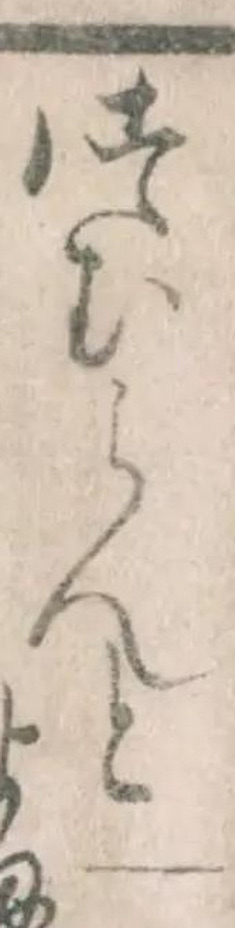つむらんと
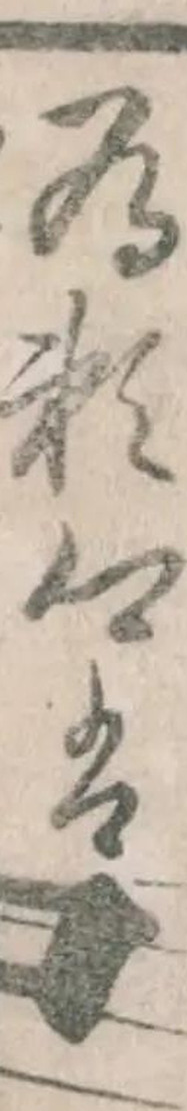為頼卿は
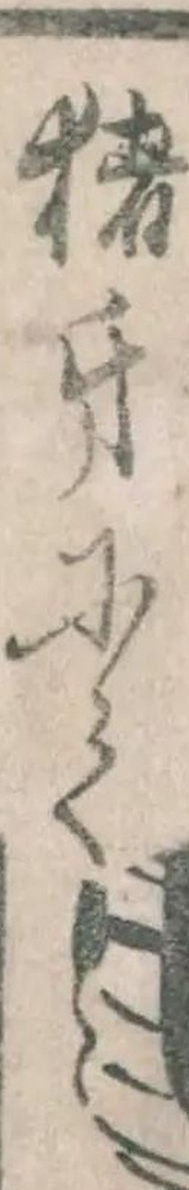猪牙にて
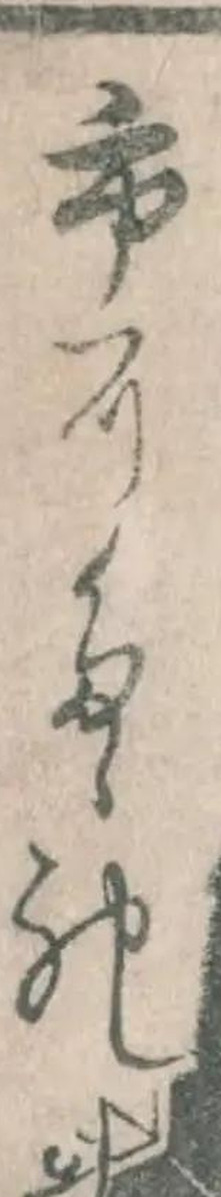市にたゝれ
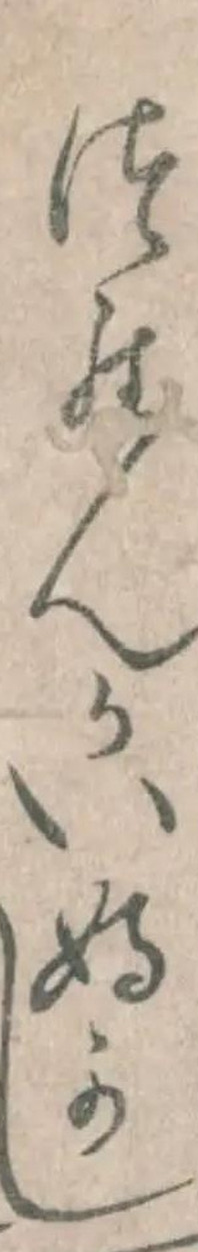つらんかいふかし

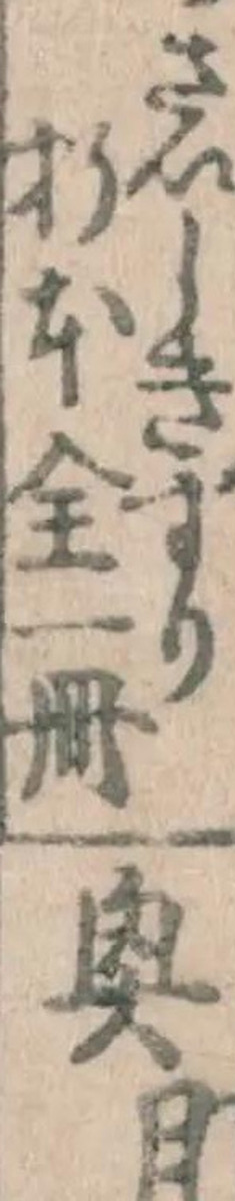折本全一冊
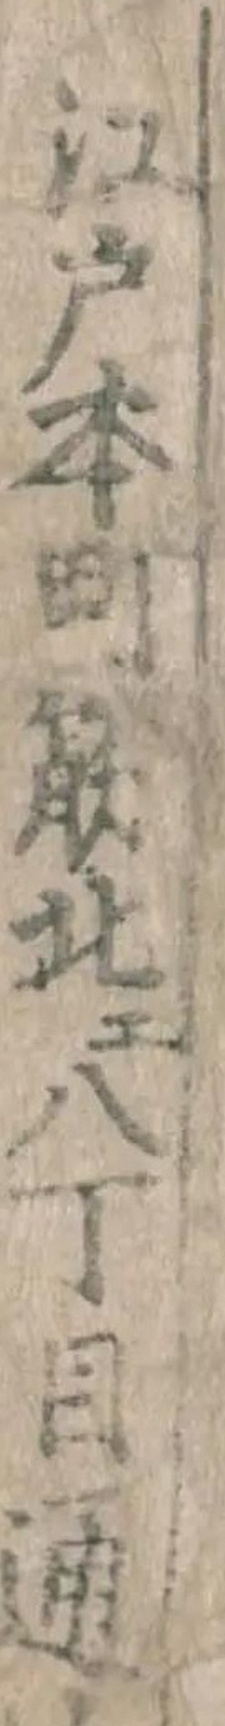江戸本町筋北ヱ八丁目通油
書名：絵本物見岡
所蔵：国立国会図書館 National Diet Library, JAPAN
